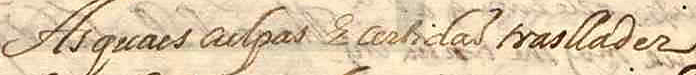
As quaes culpas E certidaõ traslladei
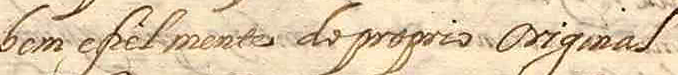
bem e fielmente do proprio original
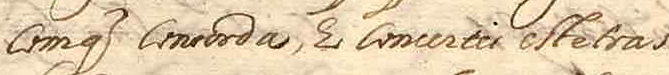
com q̄ concorda, E concertei este tras
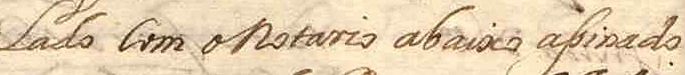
lado com o notario abaixo assinado
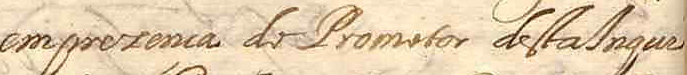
em prezença do Promotor desta Jnqui
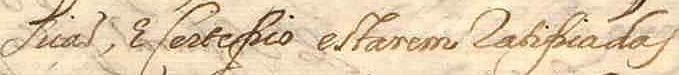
siçaõ, E Certefico estarem ratificadas
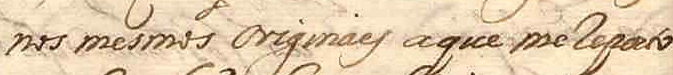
nos mesmos originaes a que me reporto
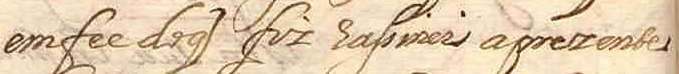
em fee do q̄ fiz E assinei a prezente
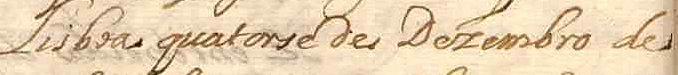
Lisboa quatorse de Dezembro de
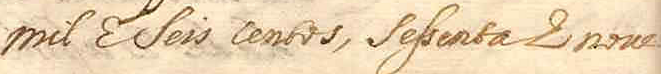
mil E seiscentos, e sessenta E noue
